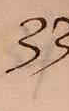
33
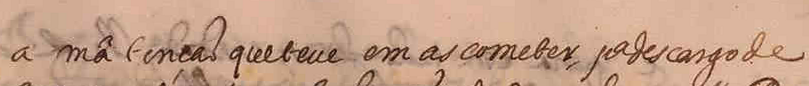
a má tençaõ que teue em as cometer, pa descargo de
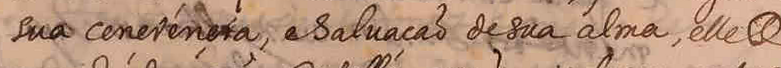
sua conçiençia, e saluaçaõ de sua alma, elle R
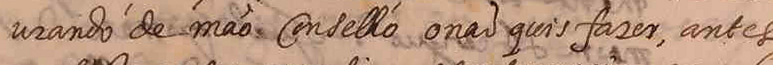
uzando de mao Conselho o naõ quis fazer, antes
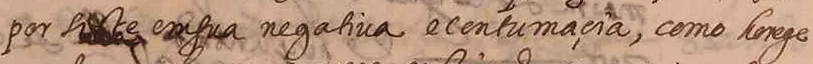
persiste em sua negatiua e contumaçia, como herege
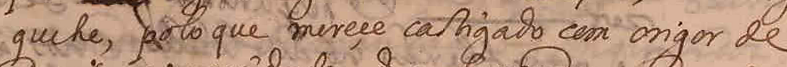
que he, polo que mereçe castigado com o rigor de
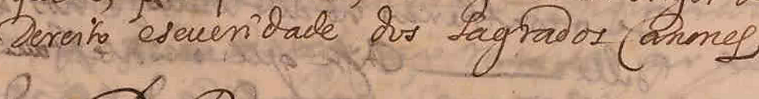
Dereito e seueridade dos Sagrados Canones
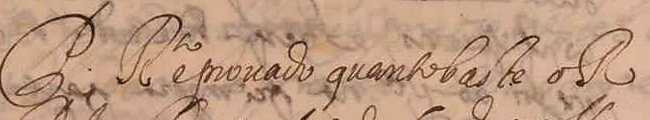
P R.to e prouado quanto baste o R.
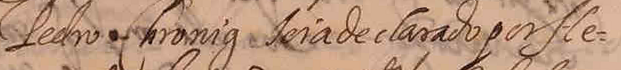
Pedro Chronig seia declarado por He
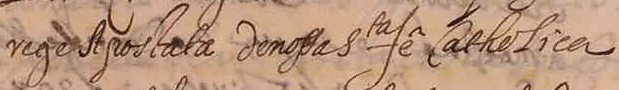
rege Apostata de nossa sta fé Catholica
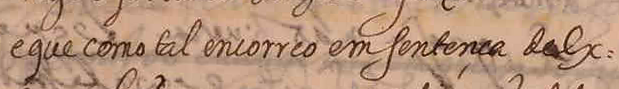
e que como tal encorreo em sentença de ex
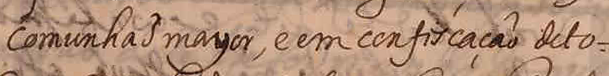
comunhaõ mayor, e em confiscação de to
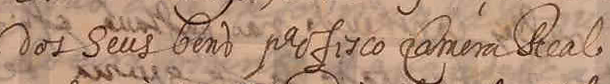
dos seus bens pa o fisco Camera Real
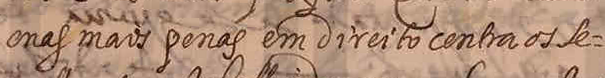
e nas mais penas em direito contra os se
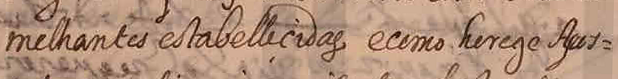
melhantes estabellecidas e como herege Apos
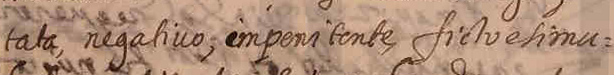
tata, negatiuo, impenitente, ficto e simu
